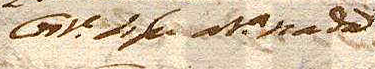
Cost.e disse a t.a nada
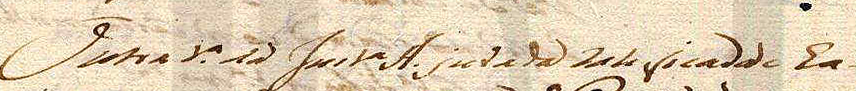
Outra t.a da Justa A. jurada Rateficada E a
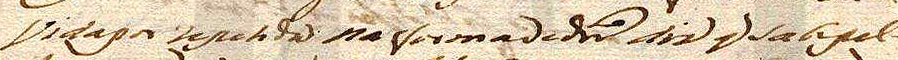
vida por Repetida na forma de drto diz q̄ sabe pel
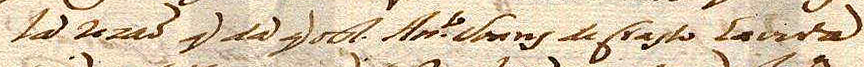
la Rezaõ q̄ da q̄ o R. An.to Soares de Crasto havera
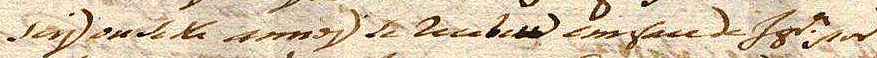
seis ou sette annos se Recebeu em face de Jgr.a por
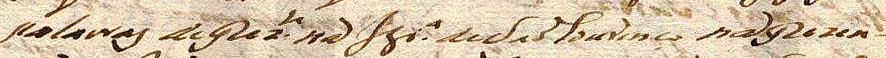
palavras de prez.te na Jgr.a de Saõ Lourenço na prezen
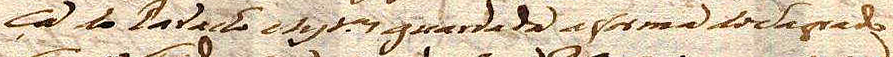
Ça do Paracho e test.as guardada a forma do Sagrado
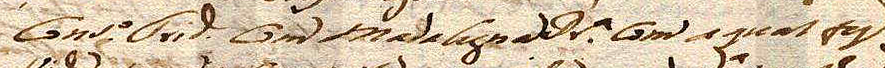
Cons.o Trid.o com Madalegna Pr.a com a qual fes
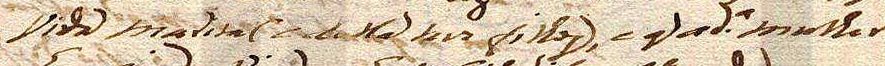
Vida marital e della teue filhos, e q̄ a d.a mulher
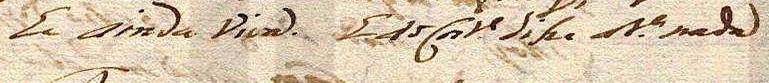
he ainda Viva. E do Cost.e disse a t.a nada
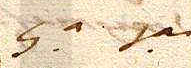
5.a t.a
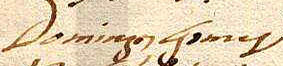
Domingos Gomes
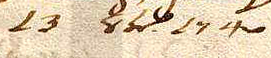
13 8br.o 1740
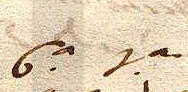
6.a t.a
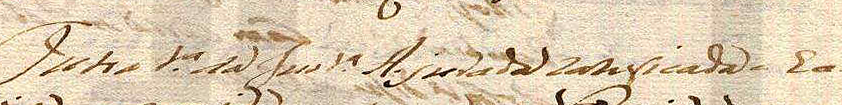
Outra t.a da Just.a A. jurada rateficada e ha
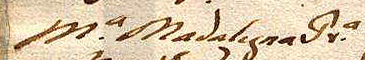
M.a Madalegna Pr.a
